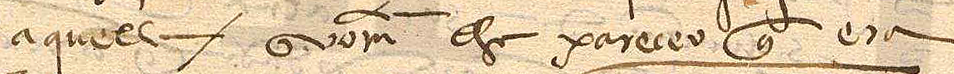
aquelle / soomte lhe pareceo q̅ era
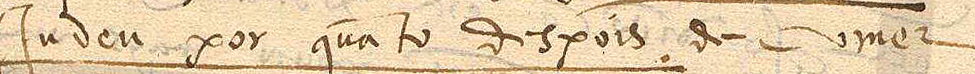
Judeu por qūato despois de comer
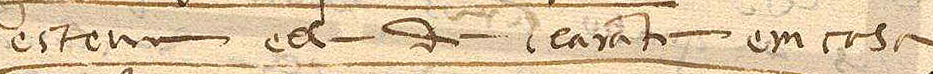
esteue elle declarāte em casa
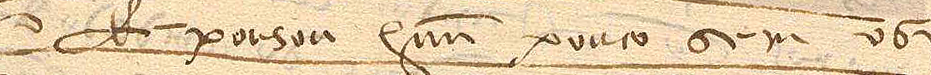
e Repousou hu̅u pouco sem os
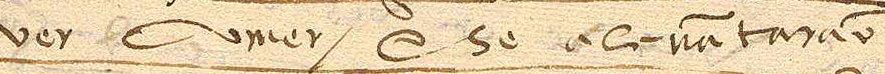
ver Comer / e se aleuātaraõ
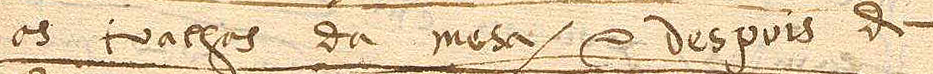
as toalhas da mesa / e despois de
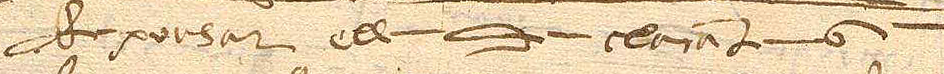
Repousar elle declara̅te se
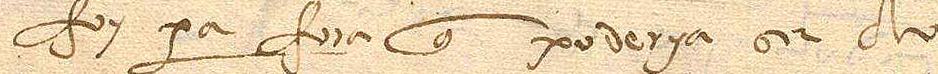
foy ꝑa fora q̅ poderya ser Ao
